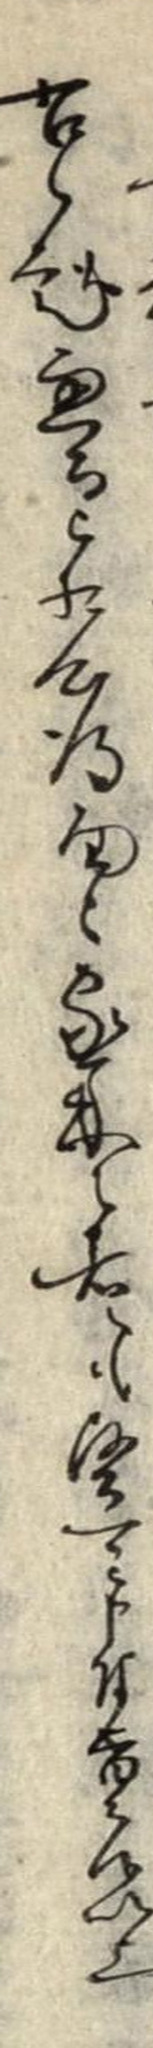右之趣兼て被相心得面々家来之者へも堅可被申付旨に候以上
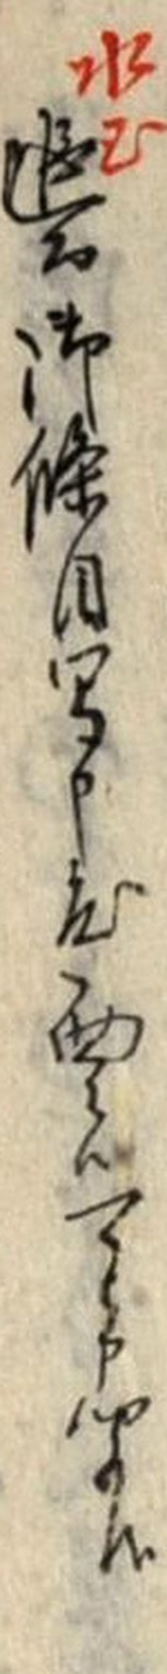追て御條目写申度面々は可申聞候

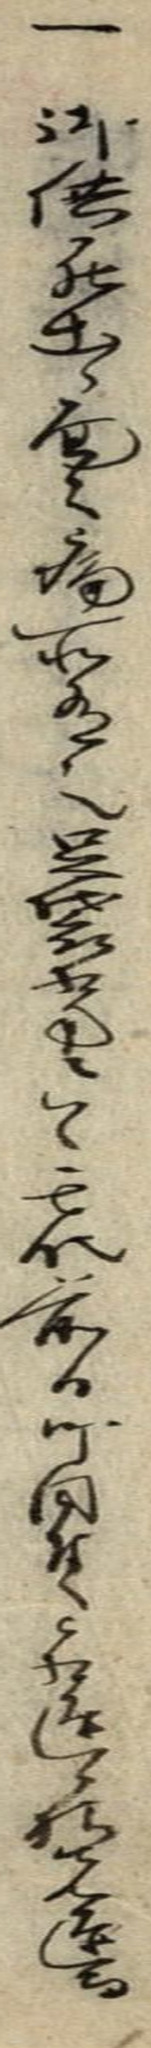一御供罷出候面々痛所有之足袋相用候はゝ其段前日御目付へ被相達候様先達て
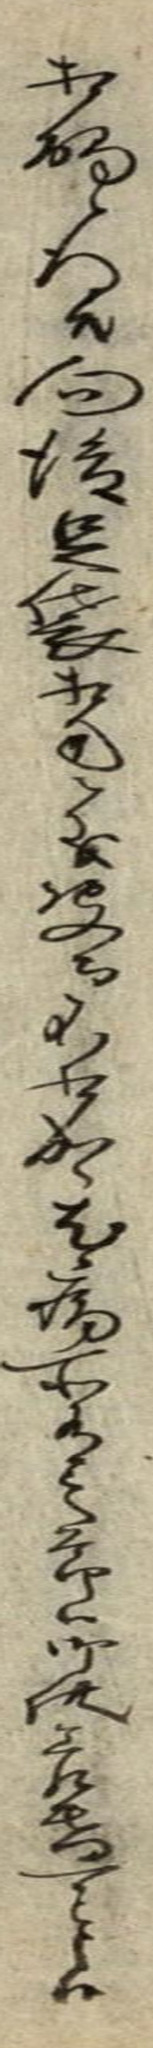相触候得共向後足袋相用候義決て不相成候尤痛所有之節は御供差替可被申候
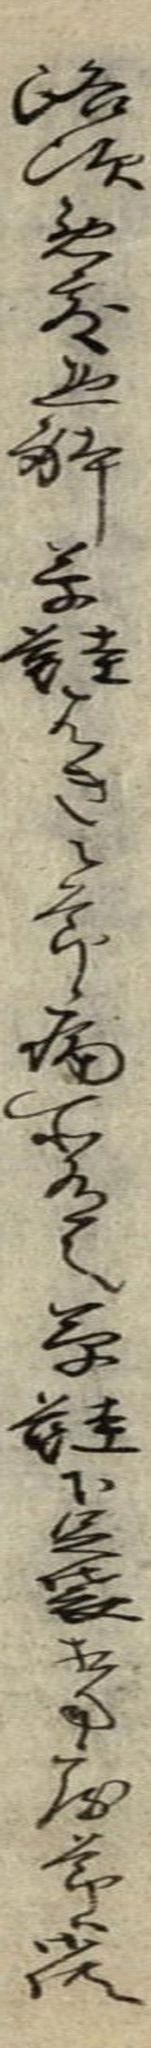一路次悪敷惣体草履はき候節痛所有之草鞋下足袋相用度節は御供
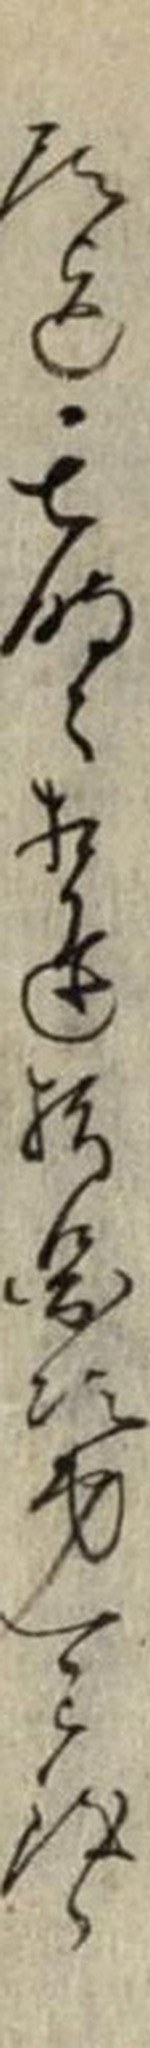頭迄其時々相達指図次第可被致候
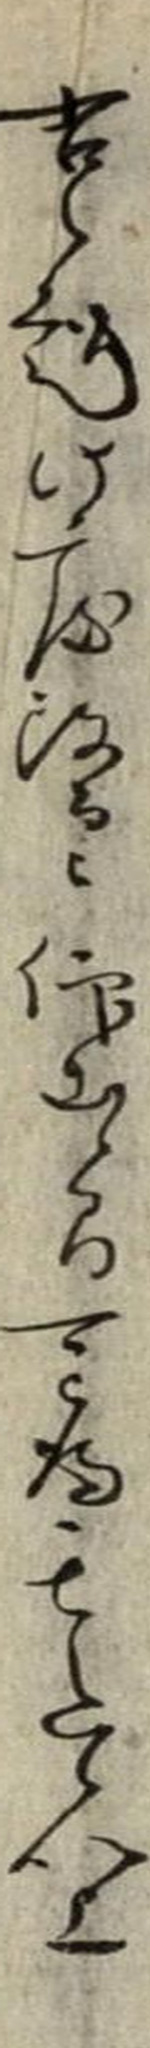右之趣此度改て被仰出候間可被得其意候以上
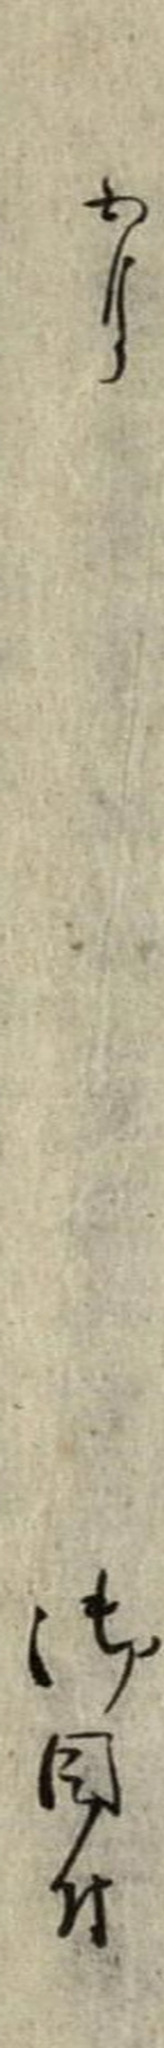五月御目付
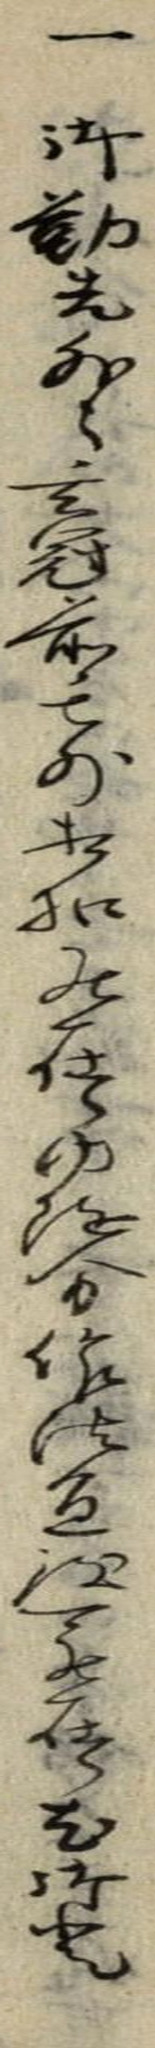一御勤先外々玄冠前其外相扣罷在候内随分作法宜致可罷在候尤御登
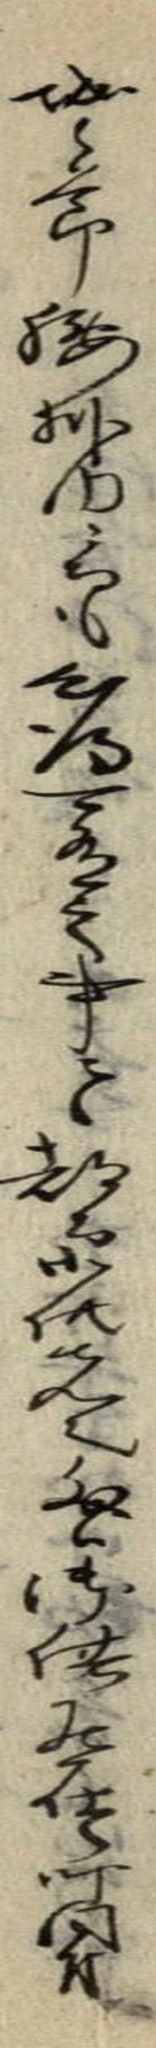城之節腰掛内にても心得可有之事に候都て御供先之義は御供罷在候御目付
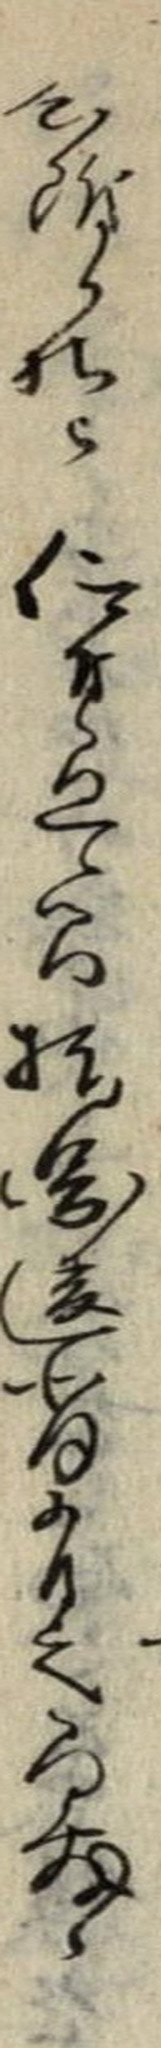心付候様被仰付置候間指図違背有之間敷候
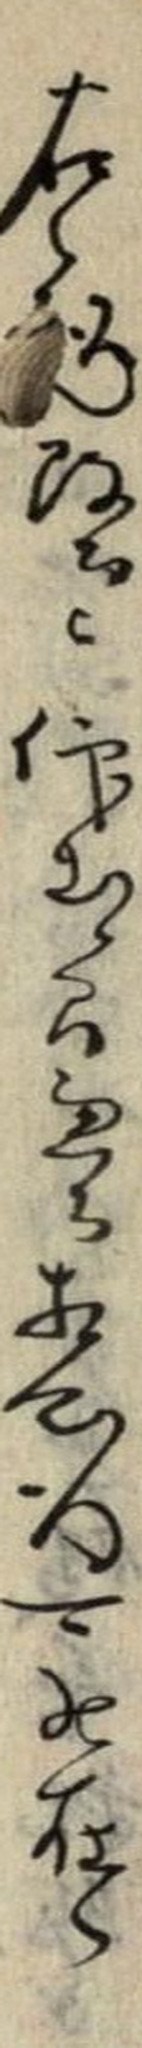右之趣改て被仰出候間兼て相心得可罷在候
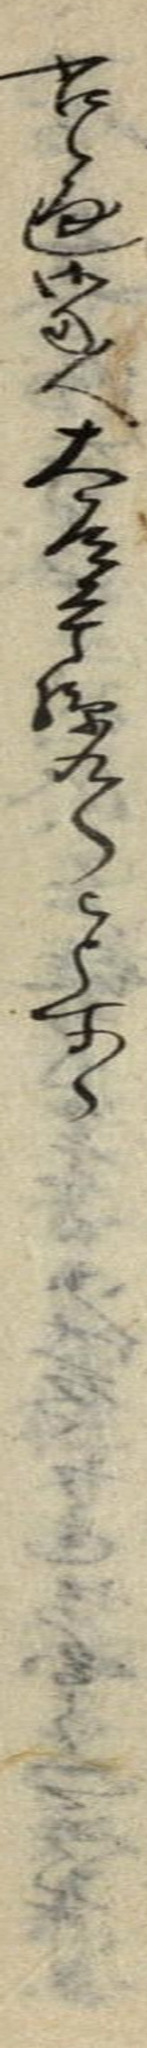右之通御用人大道寺孫九郎被申聞候
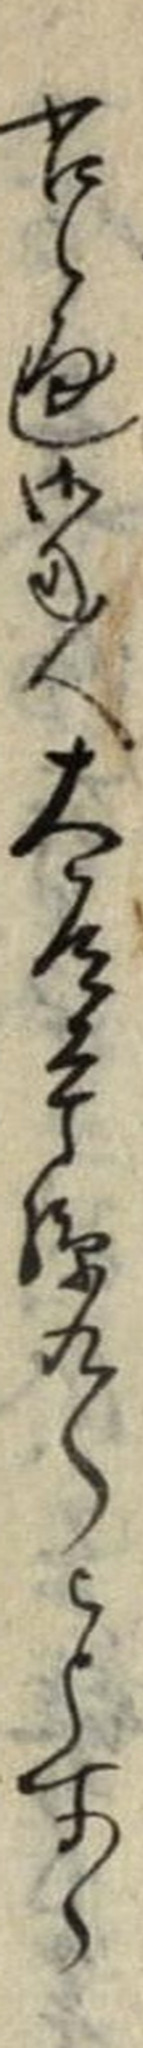右之通御用人大道寺孫九郎被申聞候
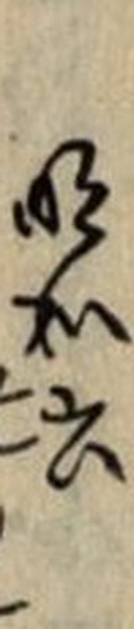明和六
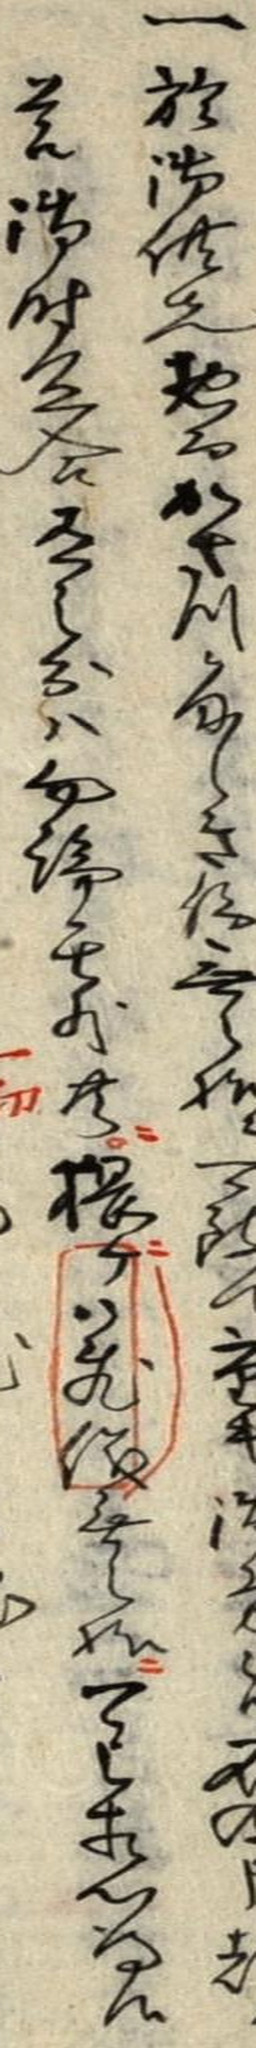節御時宜合有之分は勿論其外共猥「ケ間敷儀」無之様可被相心得候
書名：三都并道中之部
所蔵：福井県文書館 Fukui Prefectural Archives
